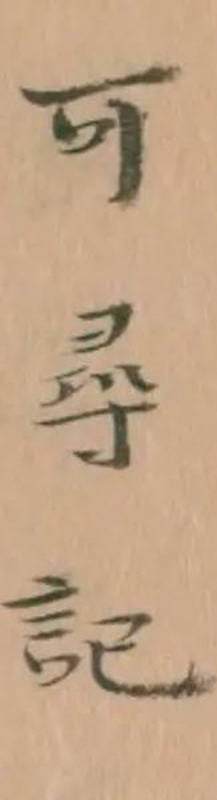可尋記
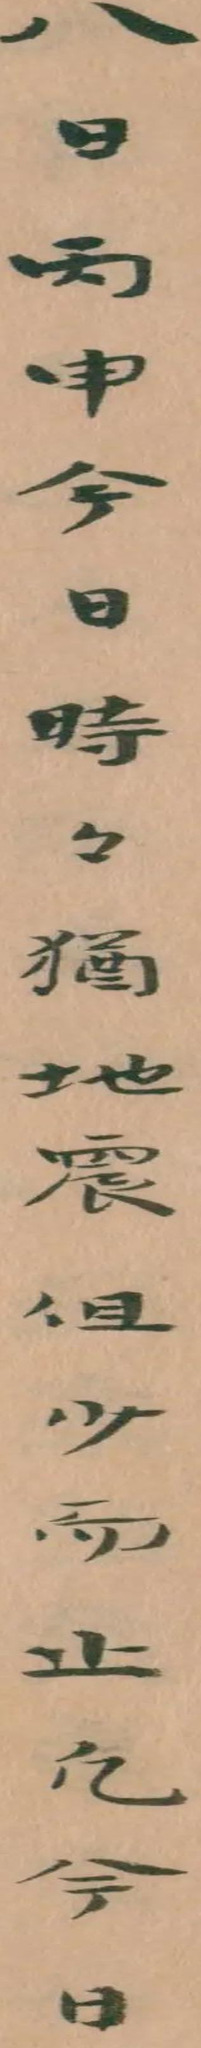八日丙申今日時々猶地震但少而止凡今日
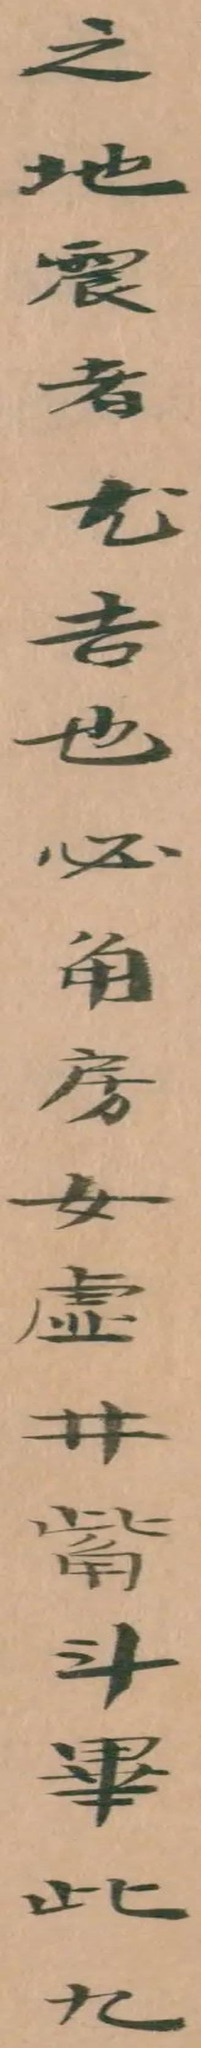之地震者尤𠮷也必角房女虚井觜計畢此九
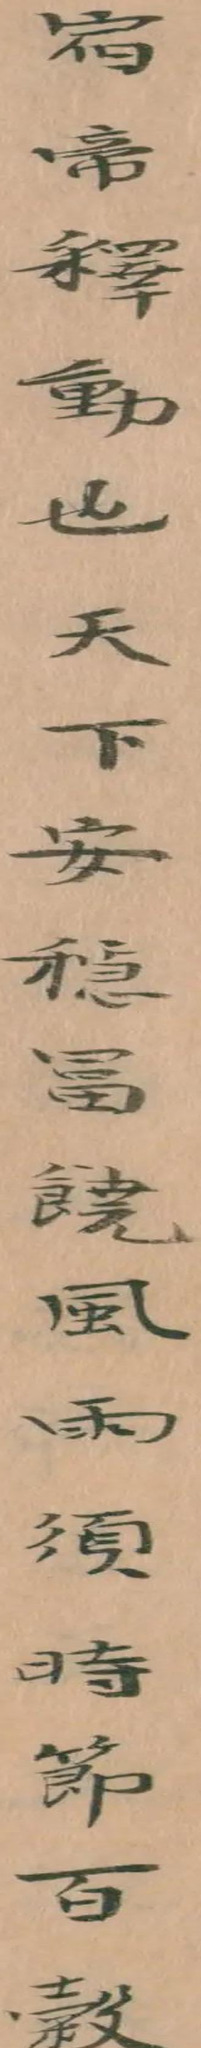宿帝釈動也天下安穏富饒風雨須時節百穀
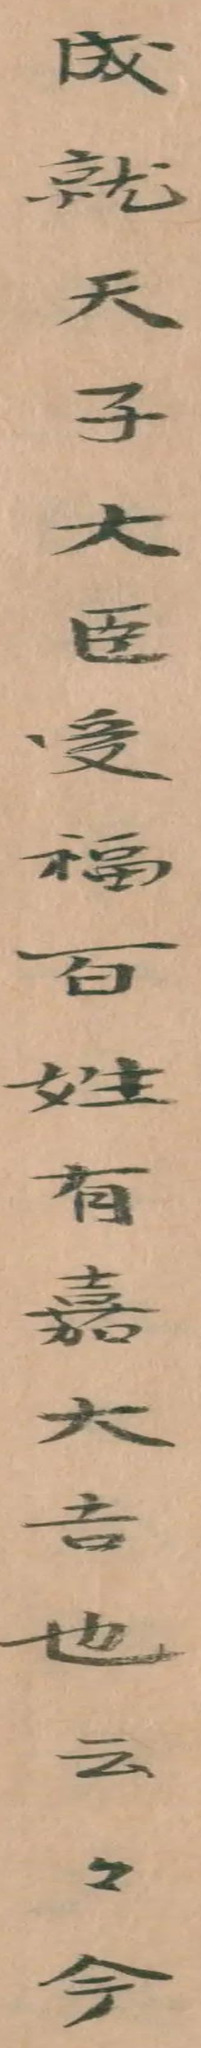成就天子大臣受福百姓有嘉大𠮷也云々今
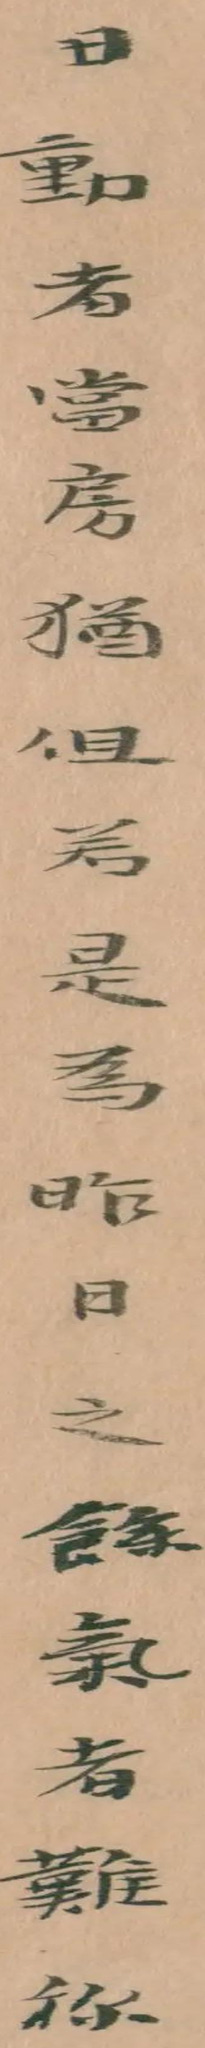日動者当房猶但若是為昨日之余気者難称
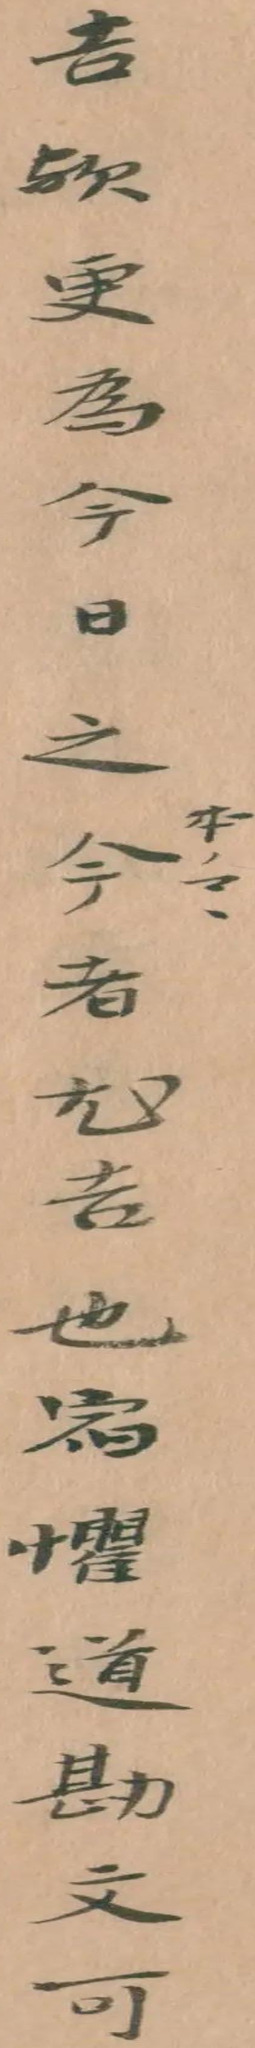𠮷歟更為今日之今者尤𠮷也宿懼道勘文可

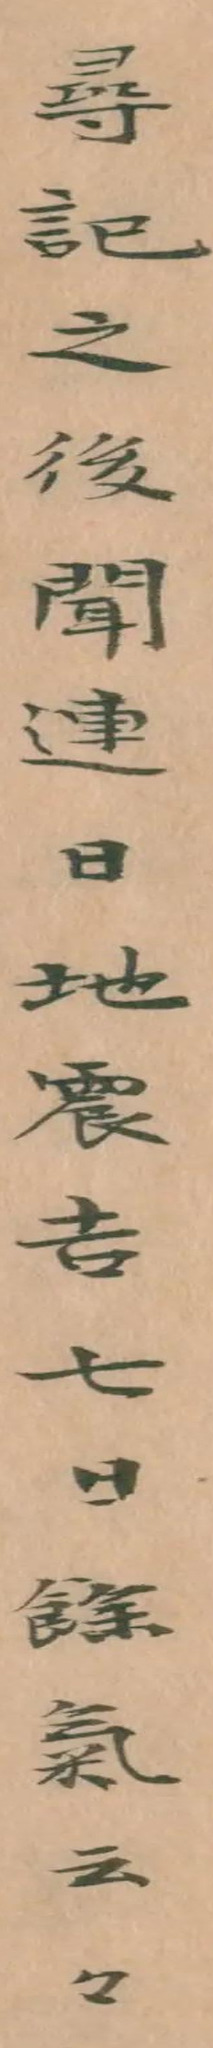尋記之後聞連日地震𠮷七日余気云々
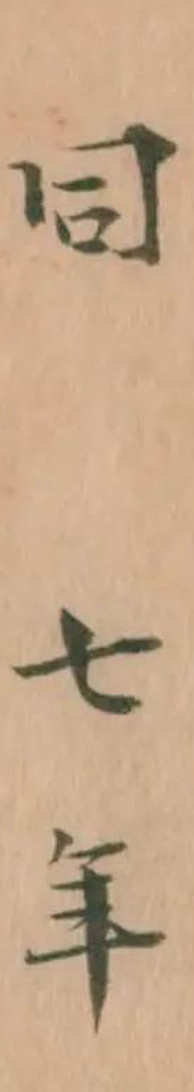同七年
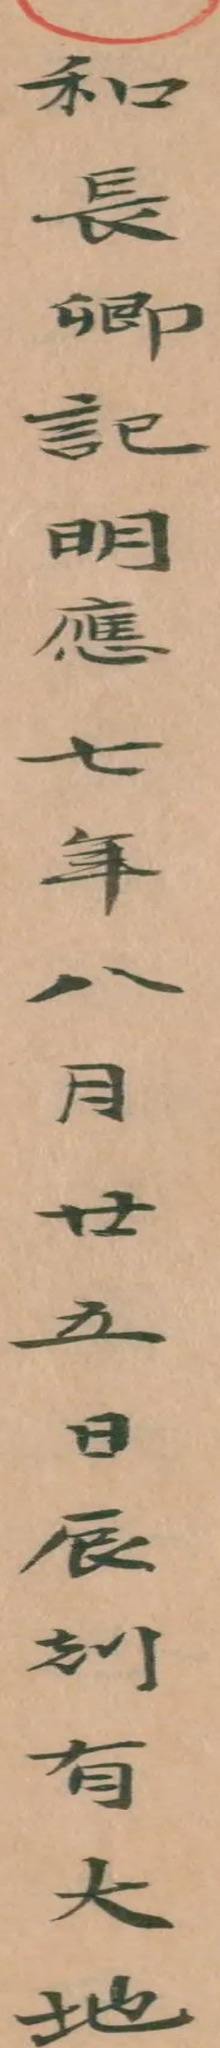○和長卿記明応七年八月廿五日辰刻有大地
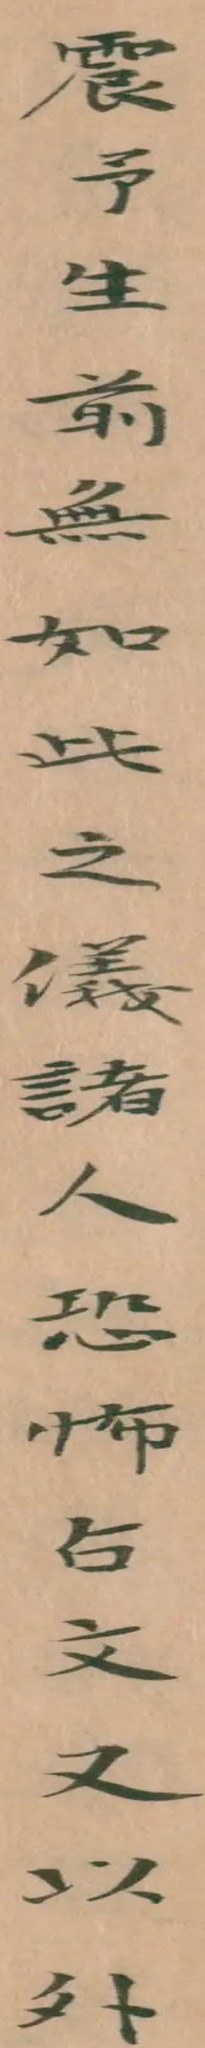震予生前無如此之儀諸人恐怖古文又以外
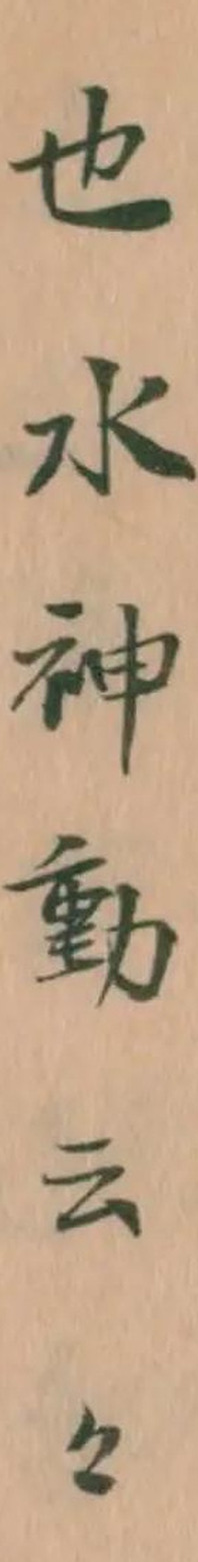也水神動云々
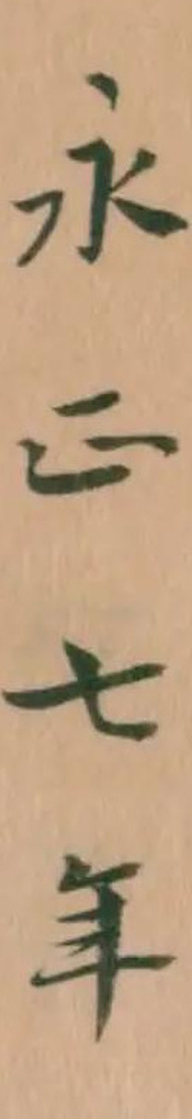永正七年
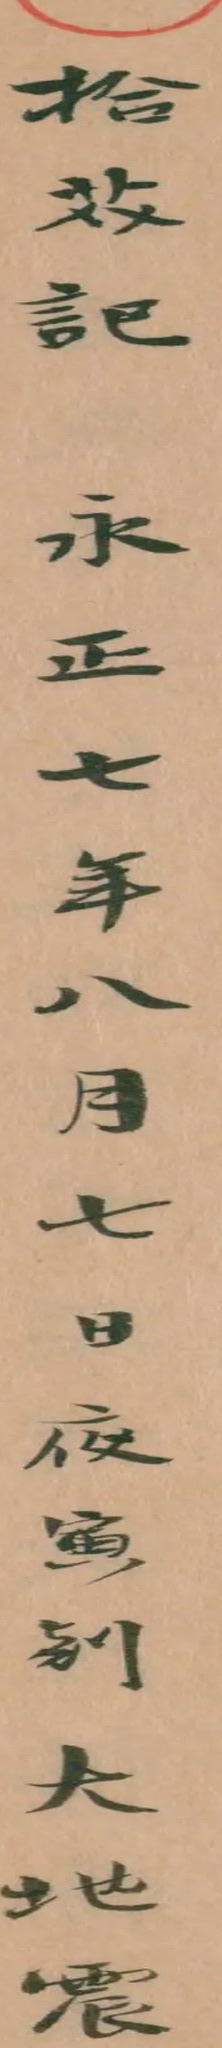○拾芥記永正七年八月七日夜寅刻大地震
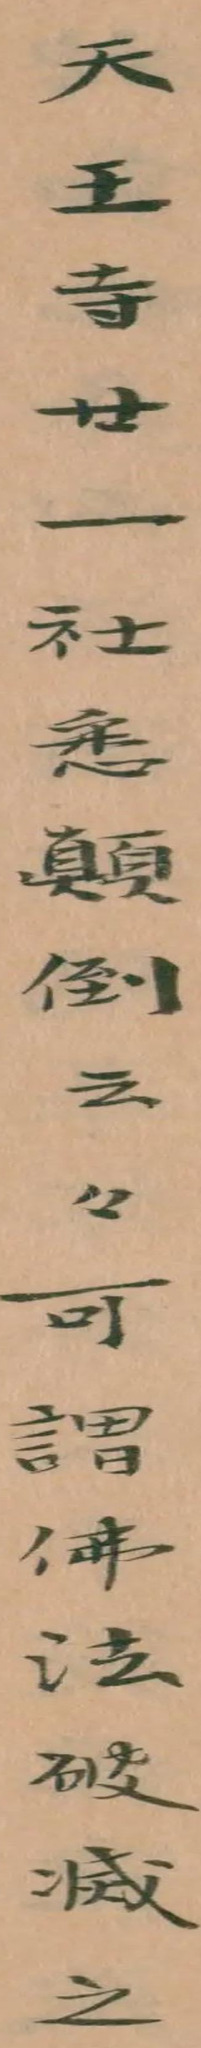天王寺廿一社悉顛倒云々可謂仏法破滅之
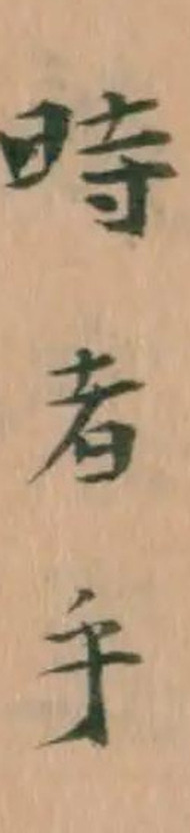時者乎
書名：地災撮要. 巻5-6(地震之部)
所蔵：国立国会図書館 National Diet Library, JAPAN
